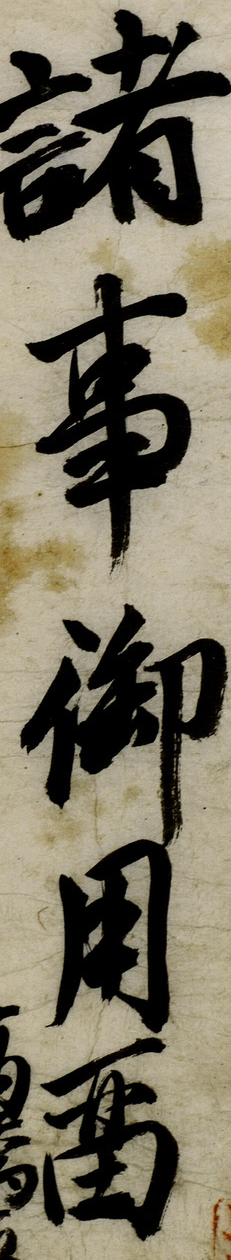諸事御用留
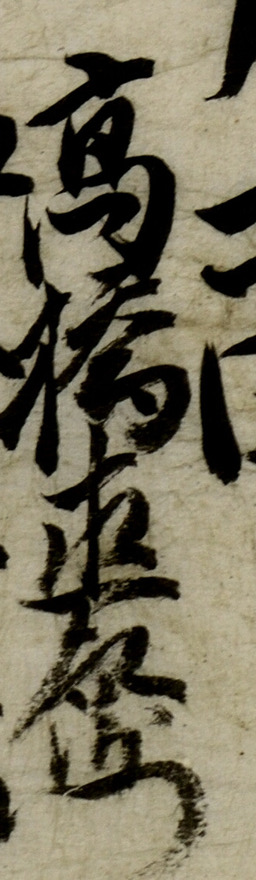高橋直左衛門
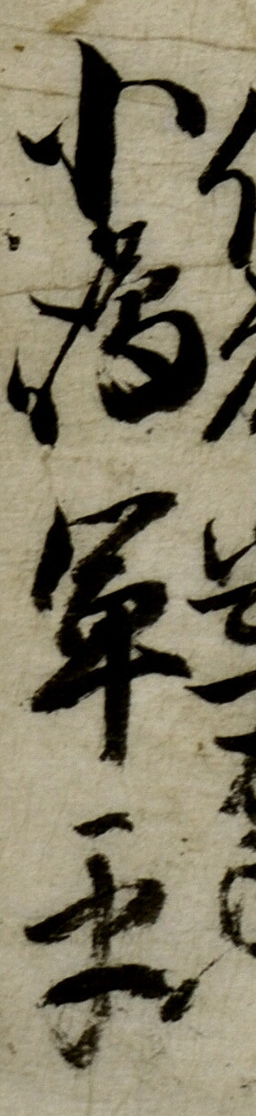小嶋軍平
